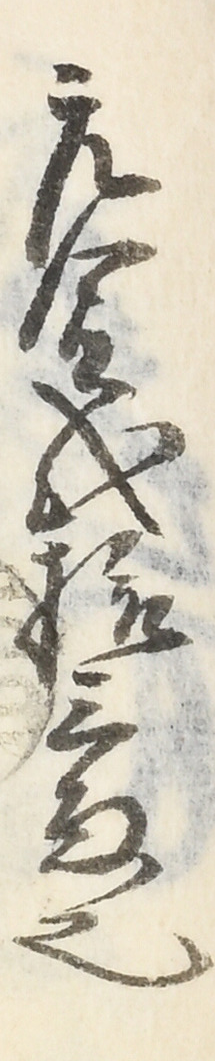元金九拾六両也
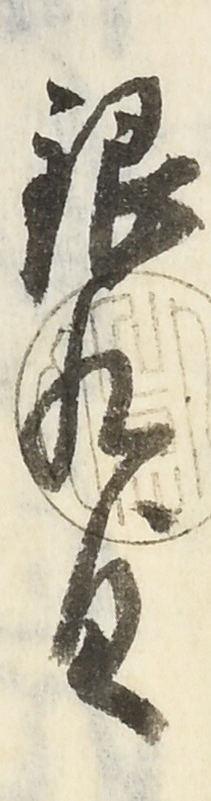銀三匁
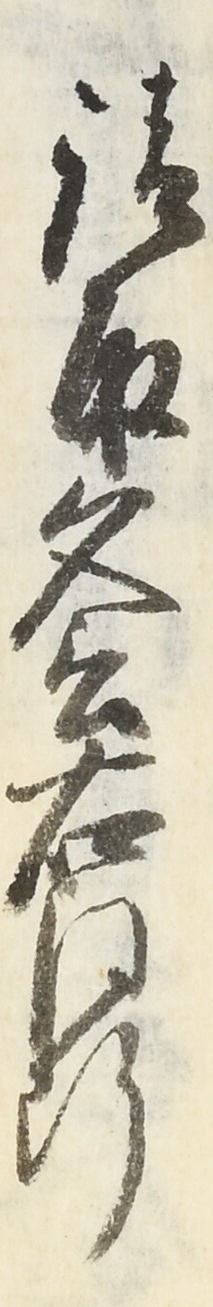請取文言右同断

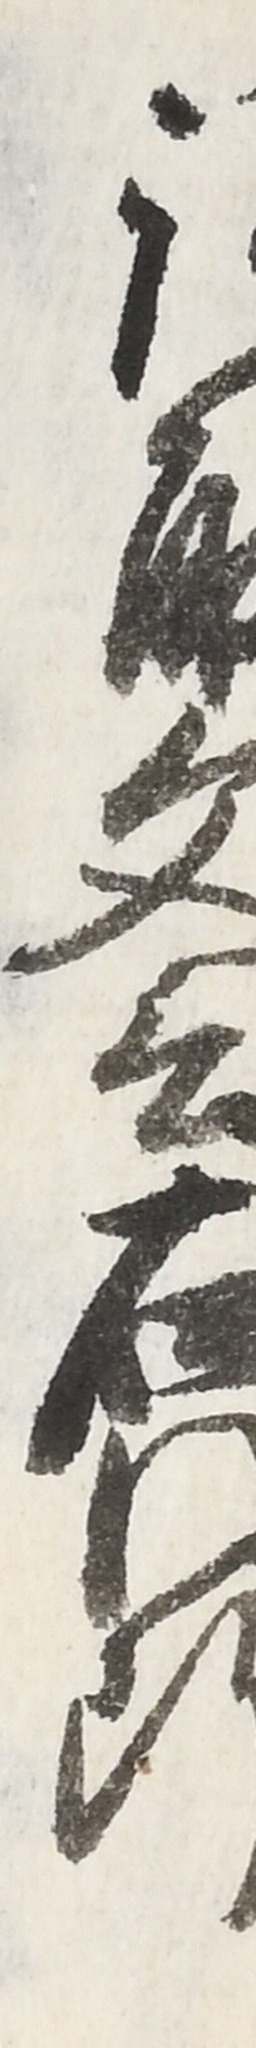請取文言右同断
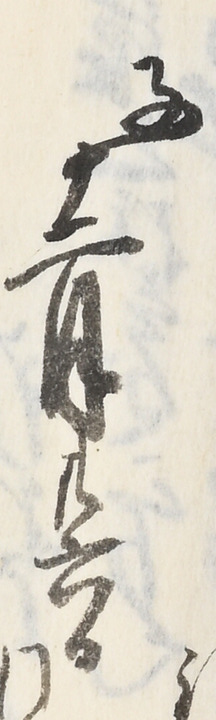十二月廿六日同断
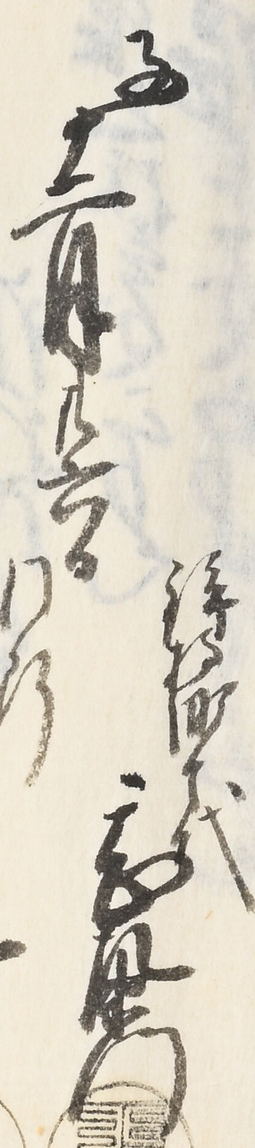十二月廿六日同断良右衛門
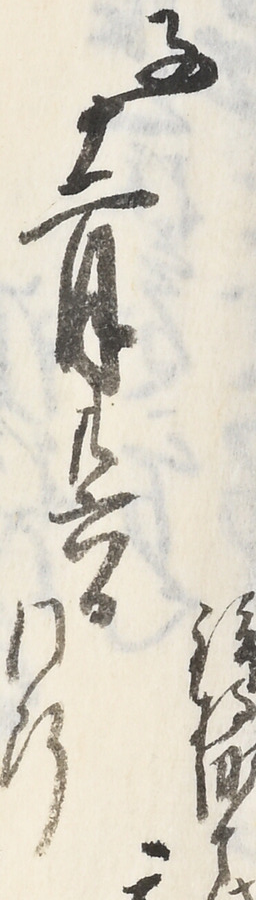十二月廿六日同断
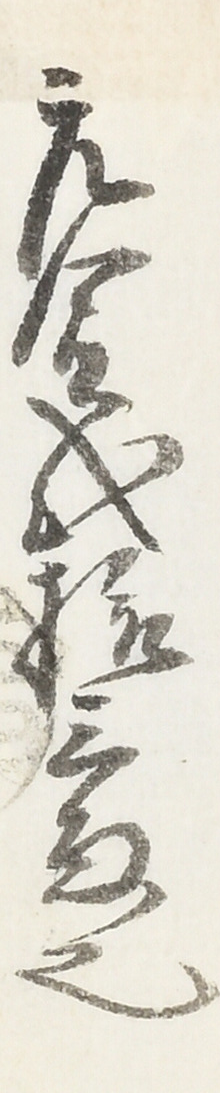元金弐拾三両也
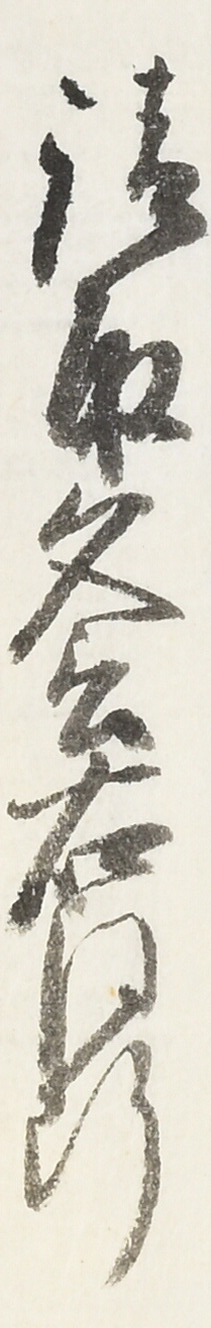請取文言右同断
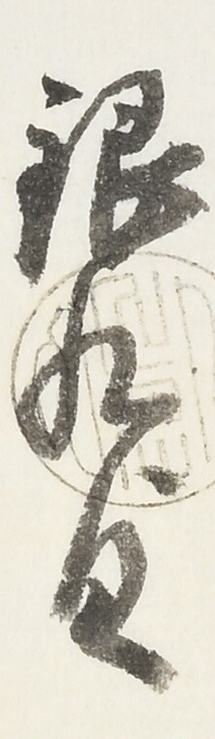銀九匁
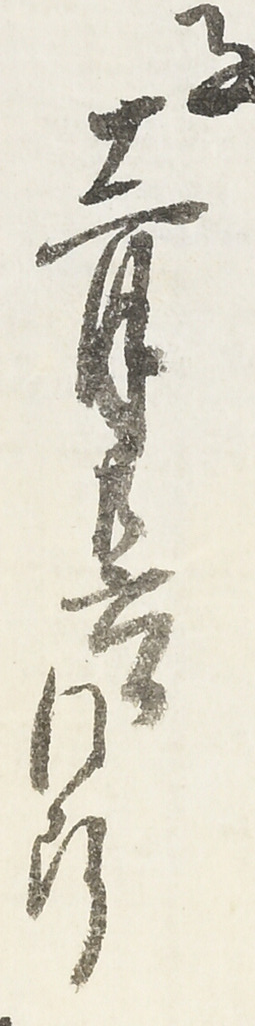十二月廿六日同断
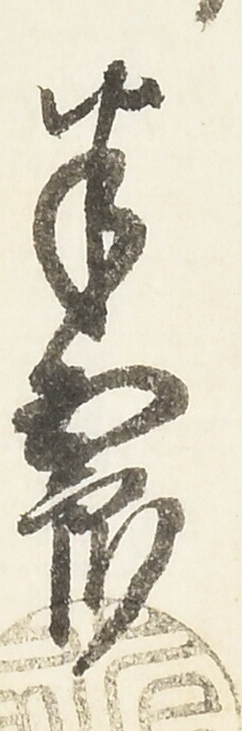半五郎
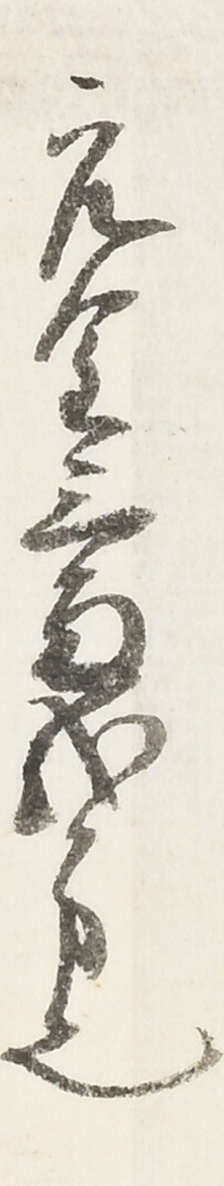元金三両弐分也
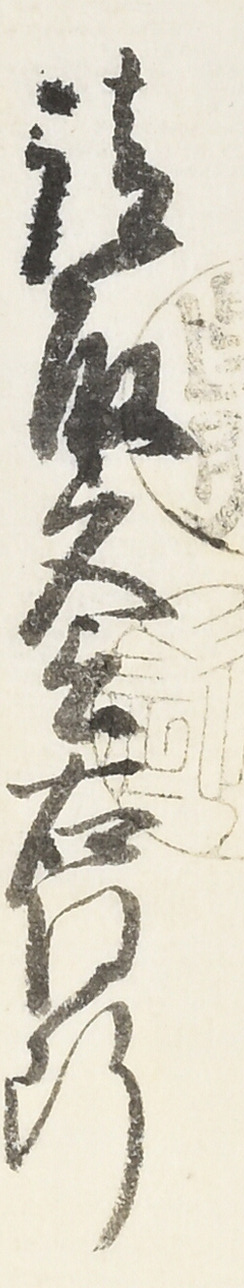請取文言右同断
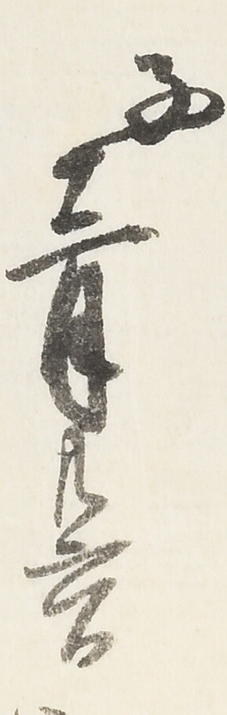十二月廿六日同断
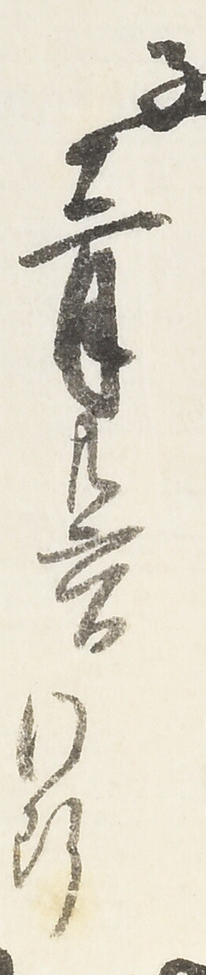十二月廿六日同断
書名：御才覚金御利足割渡扣帳
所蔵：伊那市立高遠町図書館・合同会社AMANE
